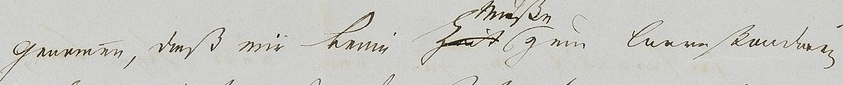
genommen, daß mir keine ZeitMuße zum Correspondiren
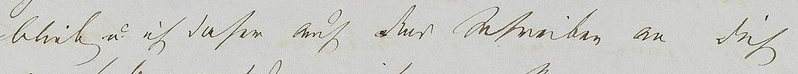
blieb u. ich daher auch das Schreiben an dich
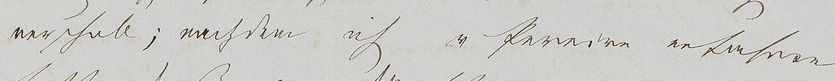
verschob; nachdem ich v. Pereire erfahren
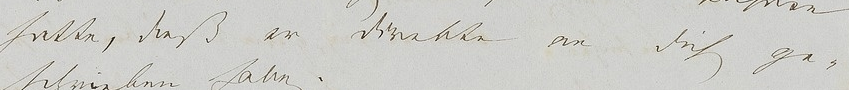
hatte, daß er direkte an dich ge-
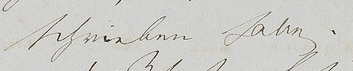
schrieben habe.
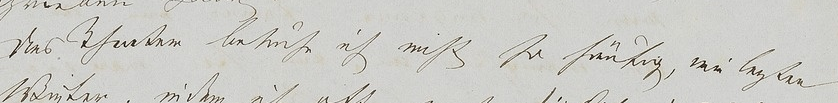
Das Theater besuche ich nicht so häufig, wie lezten
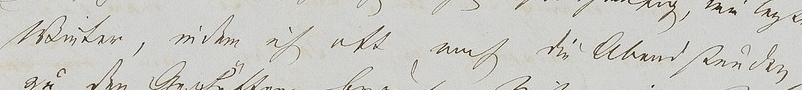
Winter, indem ich oft noch die Abendstunden
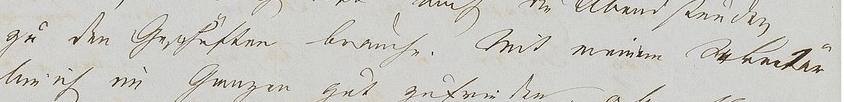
zu den Geschäften brauche. Mit meinem Sekretär
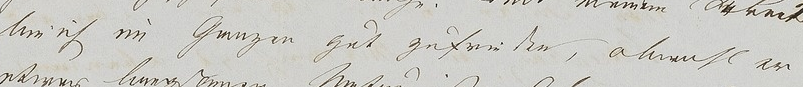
bin ich im Ganzen gut zufrieden, obwohl er
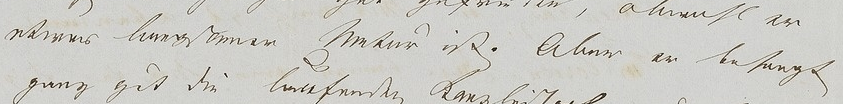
etwas langsamer Natur ist. Aber er besorgt
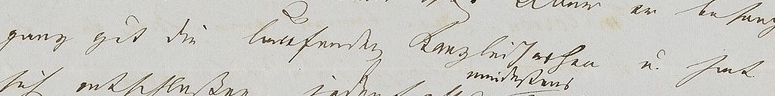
ganz gut die laufenden Kanzleisachen u. hat
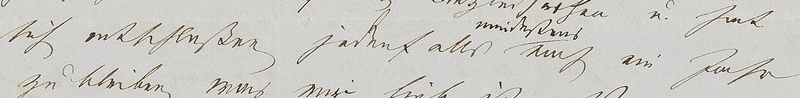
sich entschloßen jedenfalls mindestens noch ein
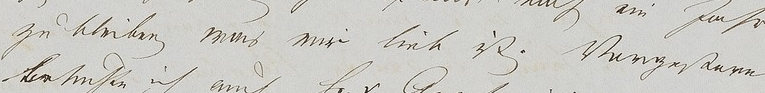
zu bleiben was mir lieb ist. Vorgestern
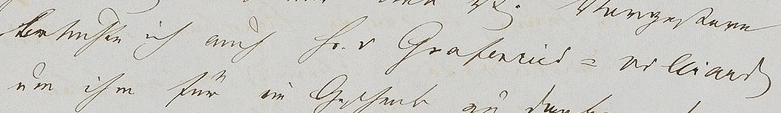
besuchte ich auch Hr. v Grafenried-Villiard
